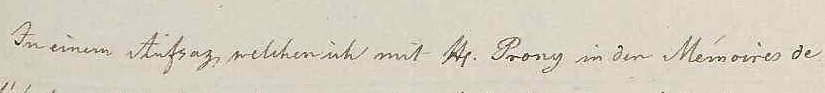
In einem Aufsaz, welchen ich mit H￼. Prony in den Mémoires de
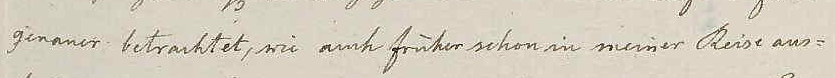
genauer betrachtet, wie auch früher schon in meiner Reise aus-
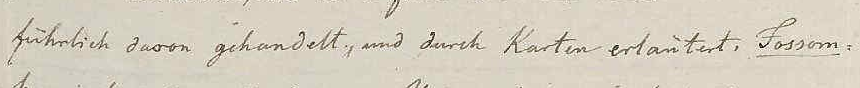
führlich davon gehandelt, und durch Karten erläutert. Fossom-
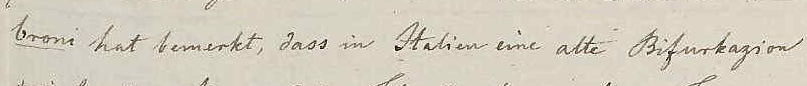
broni hat bemerkt, dass in Italien eine alte Bifurkation
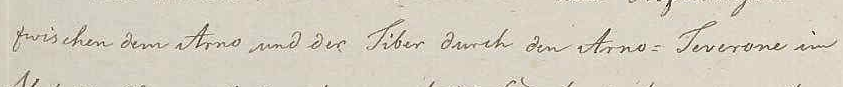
zwischen dem Arno und der Tiber durch den Arno-Teverone im
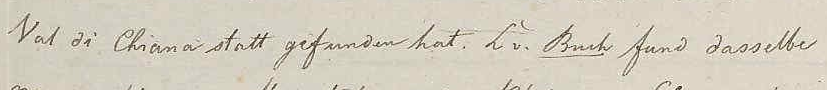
Val di Chiana statt gefunden hat. L. v. Buch fand dasselbe
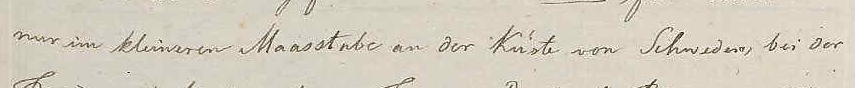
nur im kleineren Maasstabe an der Küste von Schweden, bei der
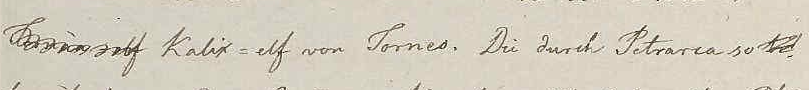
Tornäa-elf Kalix-elf von Tornes. Die durch Petrarca so be
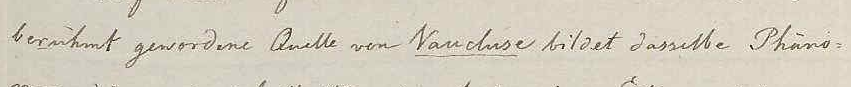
berühmt gewordene Quelle von Vaucluse bildet dasselbe Phäno-
